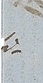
u.
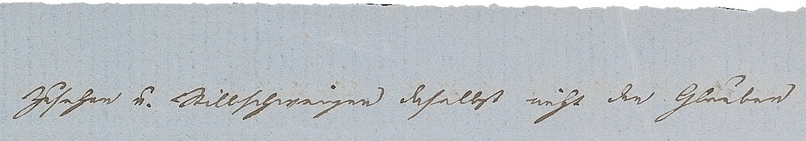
Stillschweigen daselbst
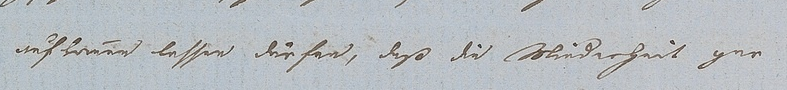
aufkommen lassen dürfen, daß die Minderheit gar
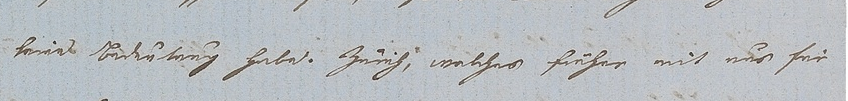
keine Bedeutung habe. Zürich, welches früher mit uns für
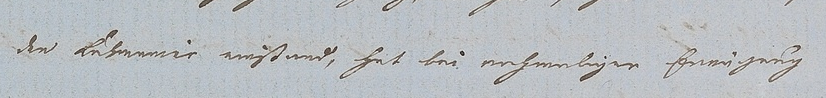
den Lukmanier einstand, hat bei nachmaliger Erwägung
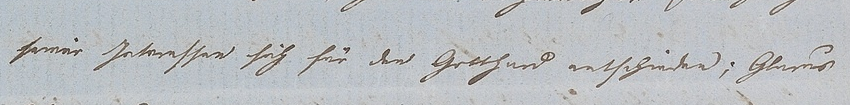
seiner Interessen sich für den Gotthard entschieden; Glarus
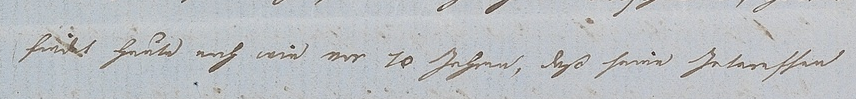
findet heute noch wie vor 10 Jahren, daß seine Interessen
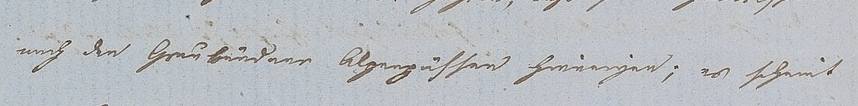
nach den GraubündnerAlpenpässen hinneigen; es scheint
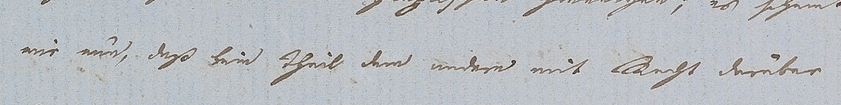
mir nun, daß kein Theil dem andern mit Recht darüber
